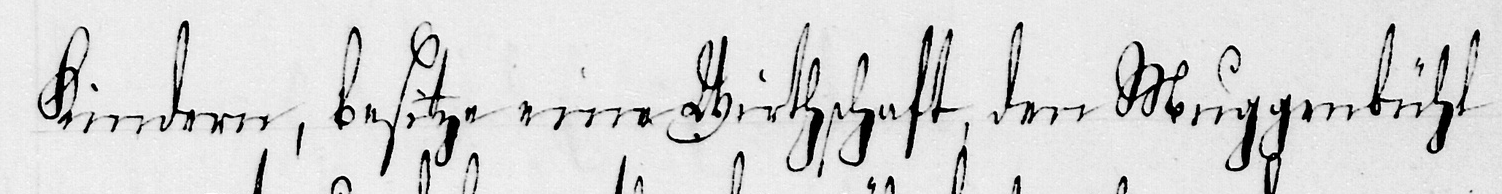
Kindern, besitze eine Wirthschaft, den Muggenbühl
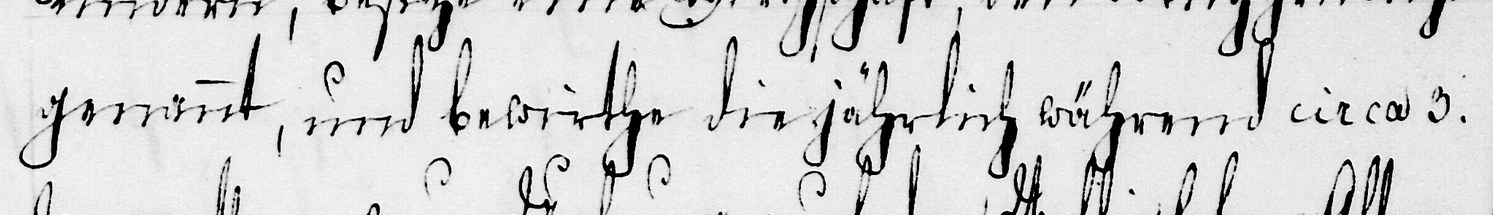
genannt, und bewirthe die jährlich während circa 3.
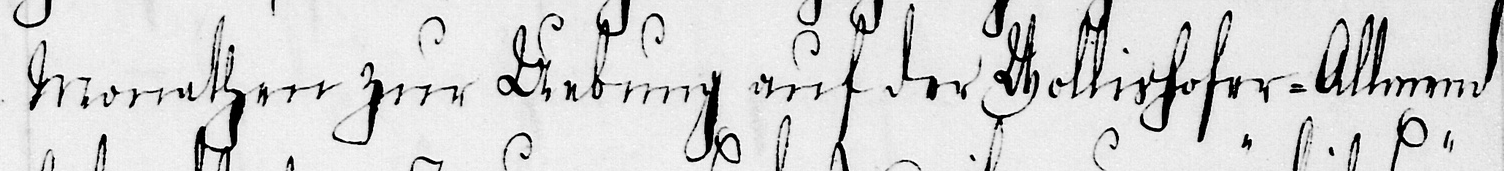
Monathen zur Uebung auf der Wollishofer-Allmend
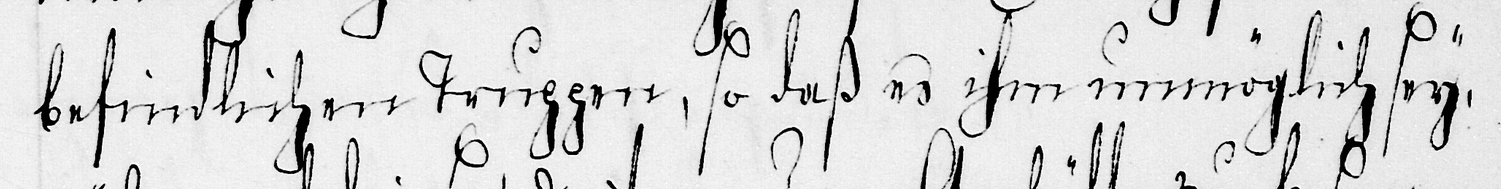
befindlichen Truppen, so daß es ihm unmöglich sey,
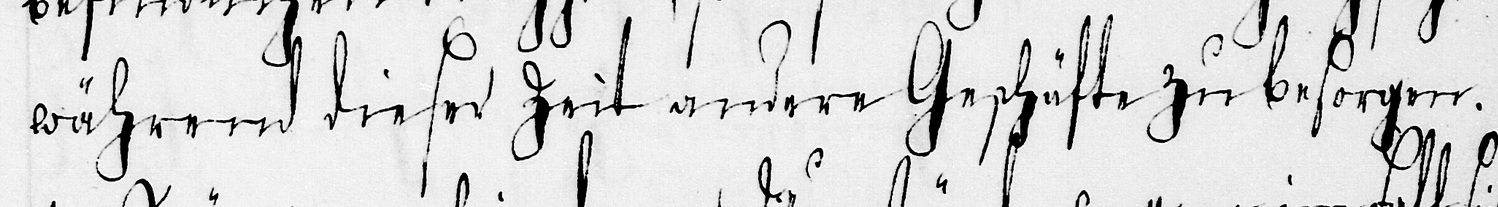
während dieser Zeit andere Geschäfte zu besorgen.
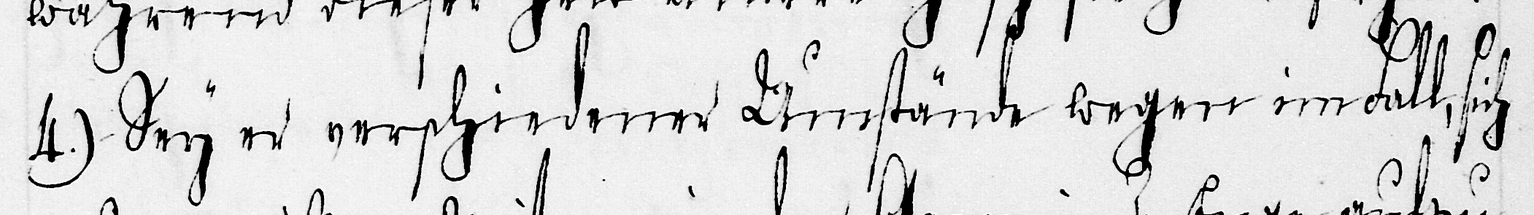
4.) Sey er verschiedener Umstände wegen im Fall, sich
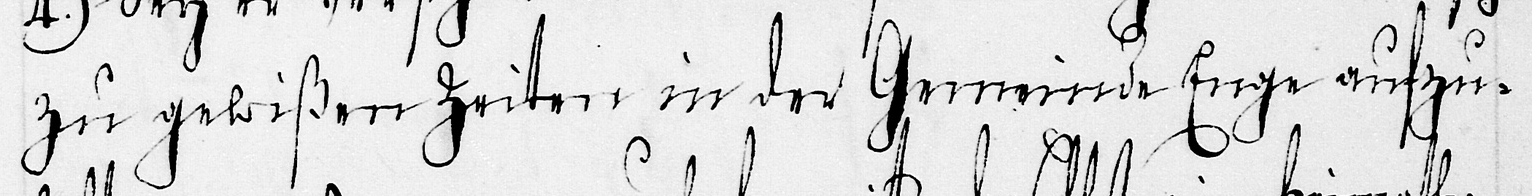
zu gewißen Zeiten in der Gemeinde Enge aufzu¬
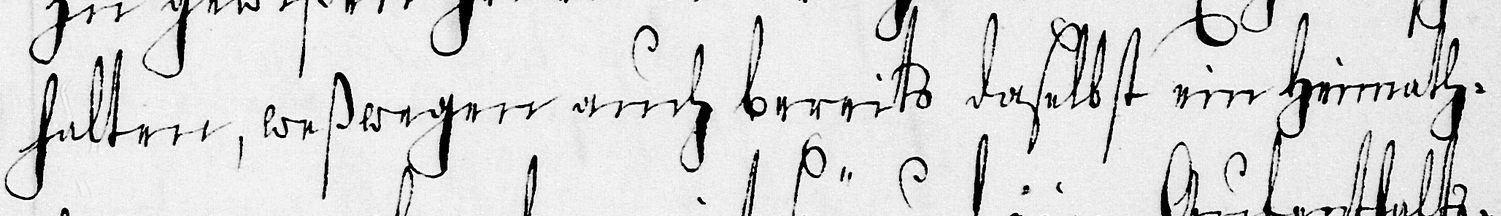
halten, weßwegen auch bereits daselbst ein Heimath¬
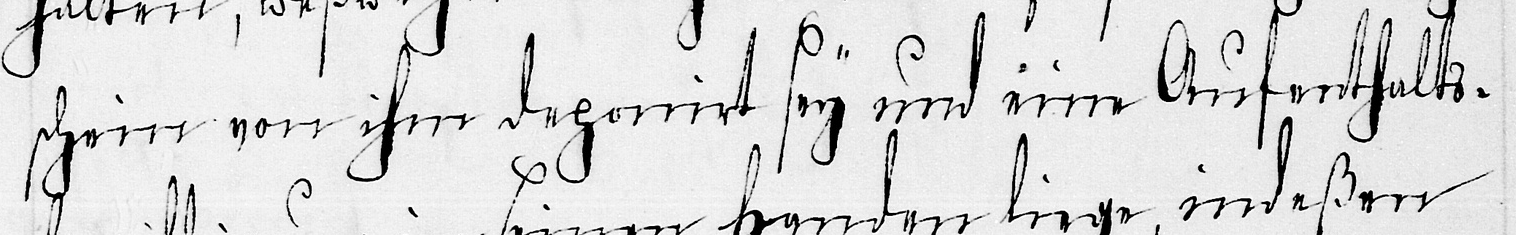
schein von ihm deponirt sey und eine Aufenthalts¬
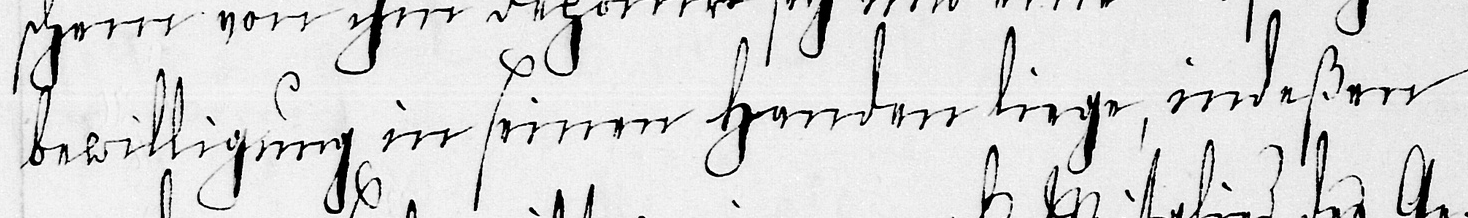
bewilligung in seinen Handen liege, indeßen
